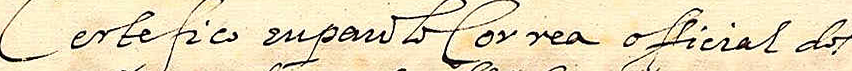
Certefico Eu paulo Correa official dos
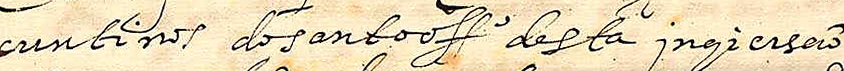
cuntinos do santo offo desta jnqicisaõ
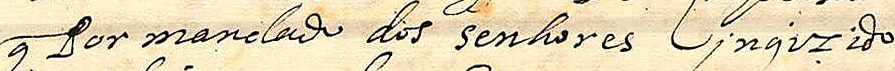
q̄ Por mandado dos senhores jnqizido
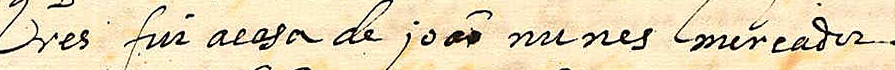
res fui a casa de joaõ nunes mercador
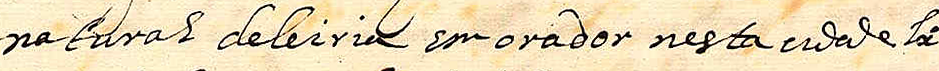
natural de leiria E morador nesta cidade lxa
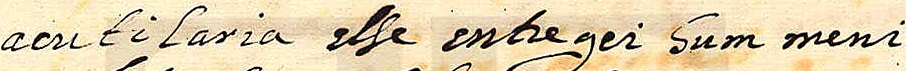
a cutilaria E lhe Entregei hum meni
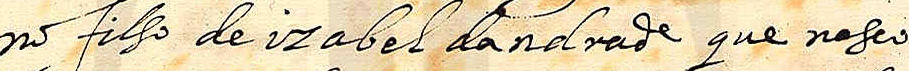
no filho de izabel dandrade que naseo
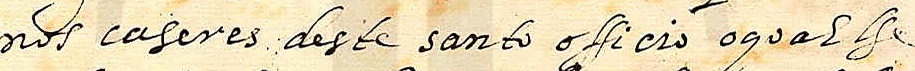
nos caseres deste santo officio o qoal lhe
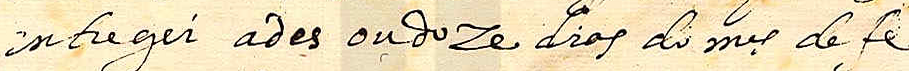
entregei a des ou doze dias do mes de fe
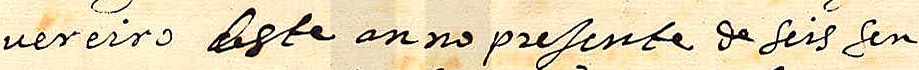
uereiro deste anno prezente de seissen
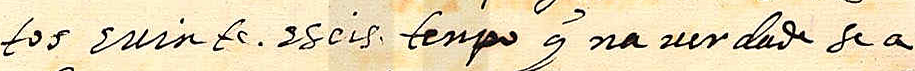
tos E uinte E seis tenpo q̄ na uerdade se a
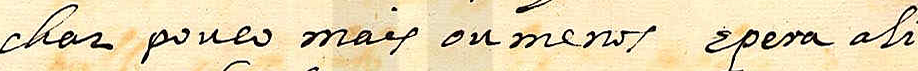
char pouco mais ou menos E pera ali
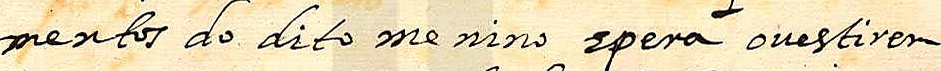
mentos do dito menino E pera o uestirem
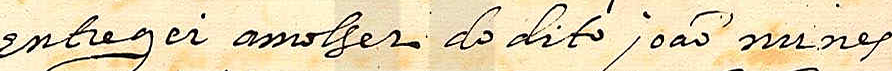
Entregei a molher do dito joaõ nunes
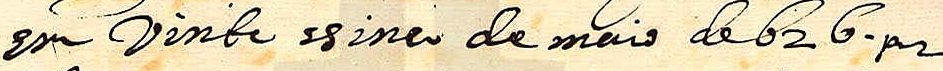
Em vinte E sinco de maio de 626. por
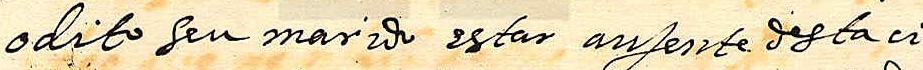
o dito seu marido Estar auzente desta ci
